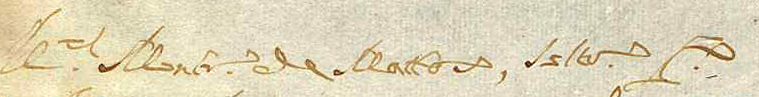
M.el Montr.o de Mattos, soltr.o f.o
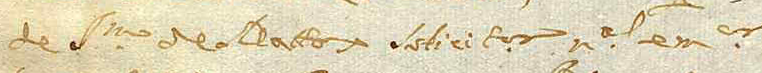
de I.mo de Mattos solicit.or n.al e m.or
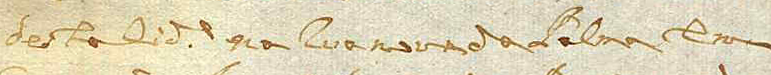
desta Cid.e na Rua nova da Palma Em
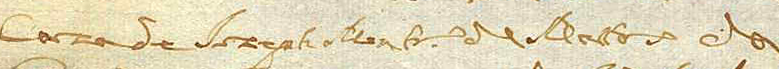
Caza de Iozeph Montr.o de Mattos da
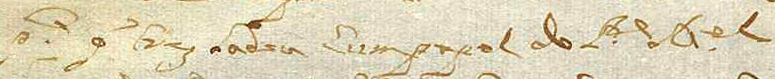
p.te q̄ trazladou hum papel do P.e M.el
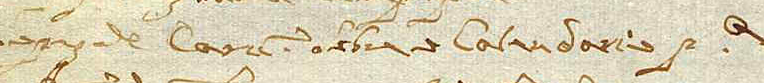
Lopez de Caru.o e abra o Calendario p.a
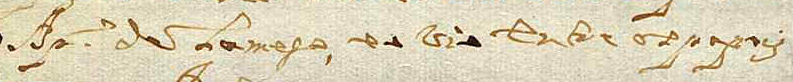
Ap.o de Lamego, e o vio entre os papeis
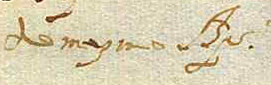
do mesmo Ap.o
